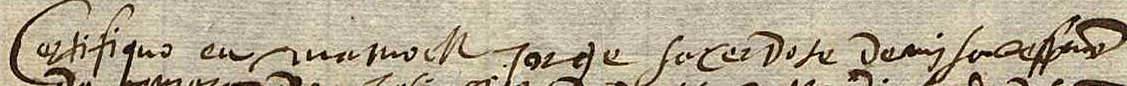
Certifiquo eu manoell Jorge sacerdote de mjsa e esp̄uaõ
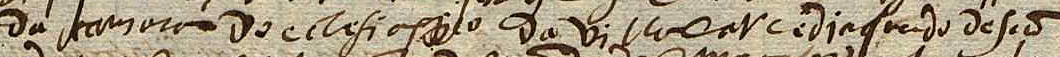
da camara do eclesiastico da villa e arcediaguado de saõ
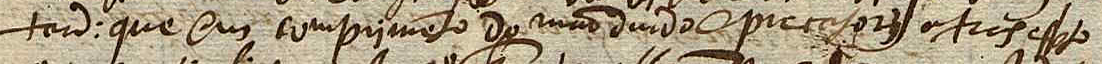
tarē: que em comprjmēto do mãodado e precatorja tras esp̄ito
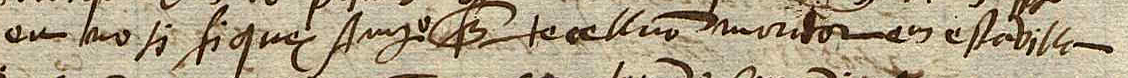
eu notifiquej Amto fz̄ tecellão morador em esta villa
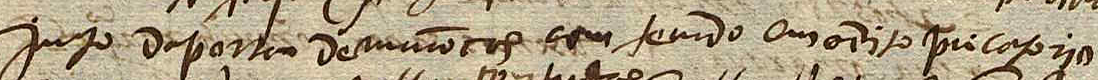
Juto da porta de maõcos comtemdo em o dito precatorjo
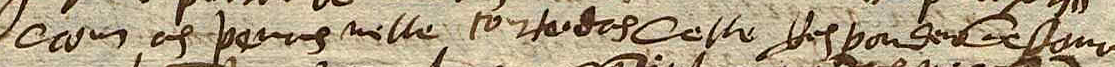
e com as penas nelle conteudas e elle Respondeu q̄ estaua
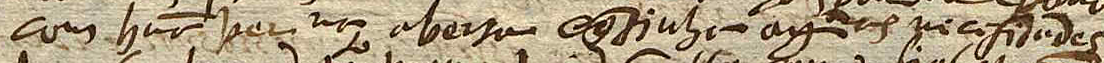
com huā perna aberta e q̄ tinha outras necesidades
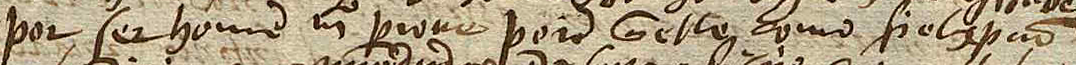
por ser homē mto proue porē q̄ elle como fiel xpaõ
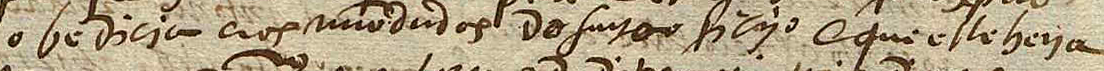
obedicia aos mãodados do santo oficyo e que elle herja
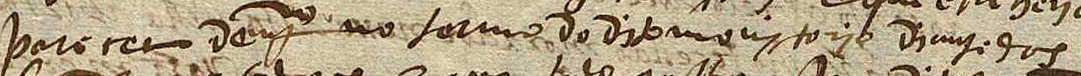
parecer demtro no termo do dito monjtorjo diamte dos
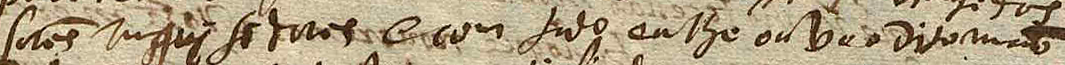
sorēs Jmqujsidores e com tudo eu lhe ouve o dito maõ
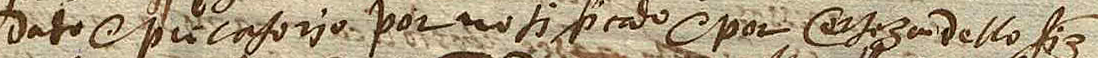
dado e precatorjo por notificado e por Certeza dello fiz
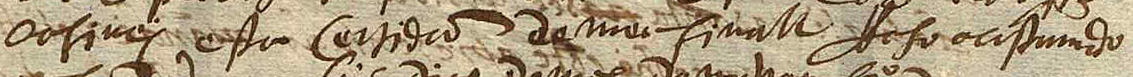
e asinej esta Certidaõ de meu sinall Raso acostumado
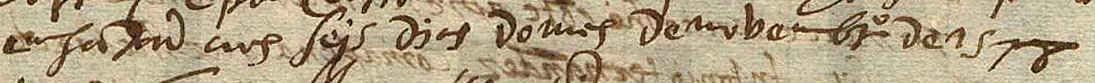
em saõtarē aos sejs dias do mes de novembro de 1578
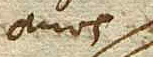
anos
